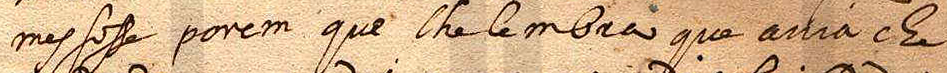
mes fosse porem que lhe lembra que auia che
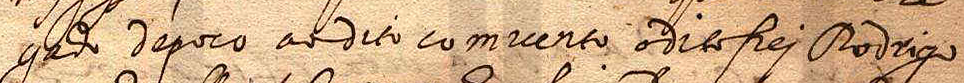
gado de poco ao dito comuento o dito frej Rodrigo
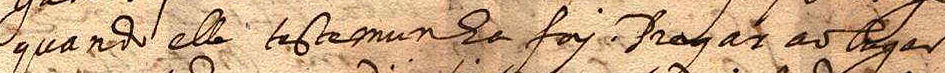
quando elle testemunha foy. Pregar ao lugar
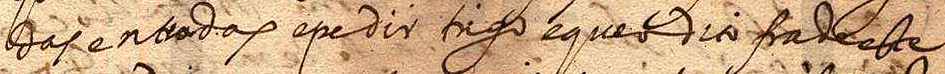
das entradas e pedir trigo e que o dito frade este
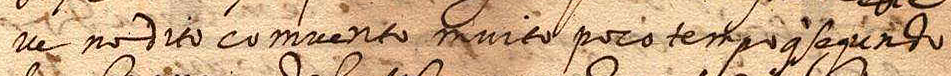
ue no dito comuento muito por o tempo q̄ segundo
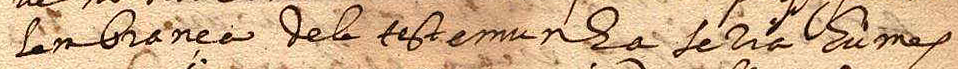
lembrança dele testemunha seria hū mes
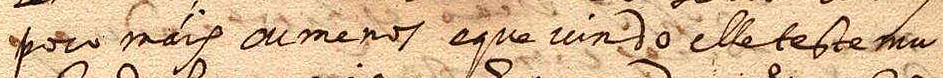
poco mais ou menos e que uindo elle testemu
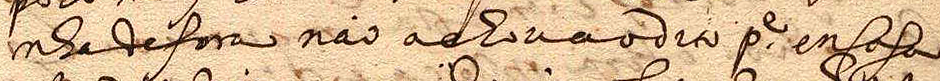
nha de fora não achou ao dito p.e en Casa
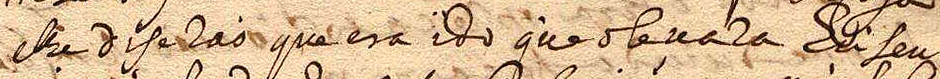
e lhe diseraõ que era ido que o leuara hū seu
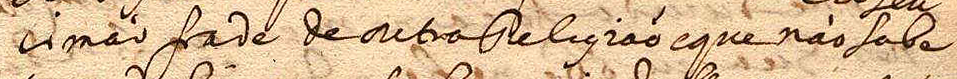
irmaõ frade de outra Religiaõ e que não sabe
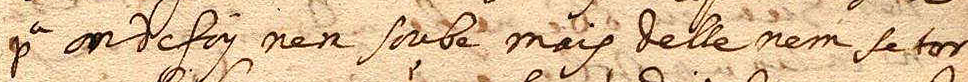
pa onde foy nem soube mais delle nem se tor
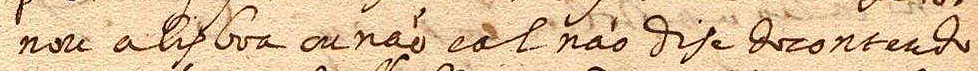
nou a lisboa ou naõ e al não dise do conteudo
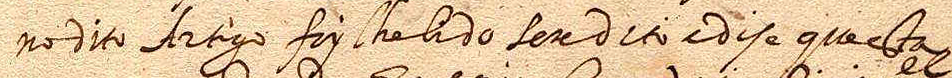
no dito Artigo foy lhe lido seu dito e dise que esta
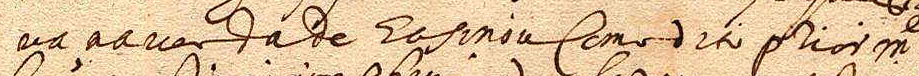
ua na uerdade E asinou Com o dito prior mel
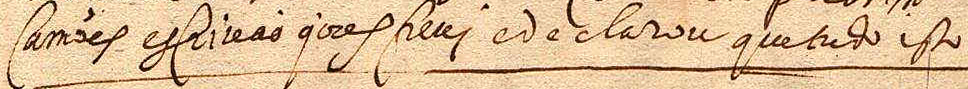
Camões esCriuaõ que sCreui e declarou que tudo isto
